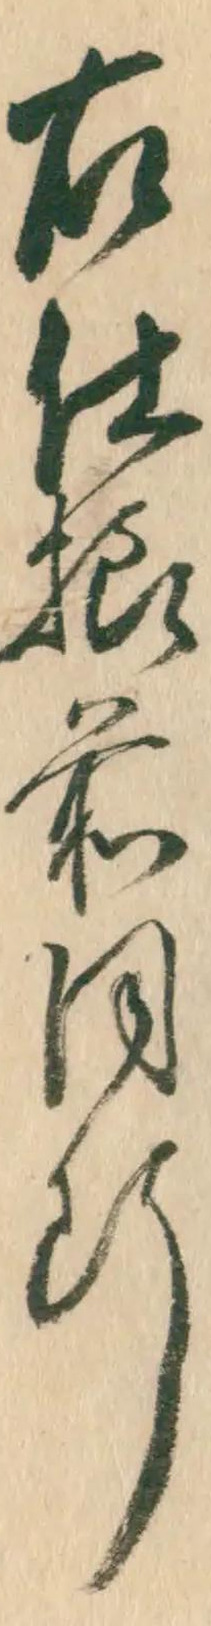右仕様前同断

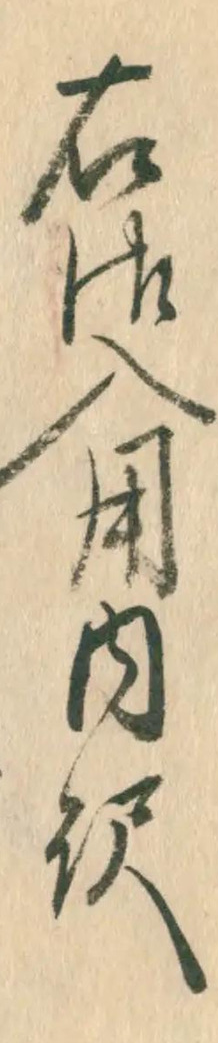右御入用内訳
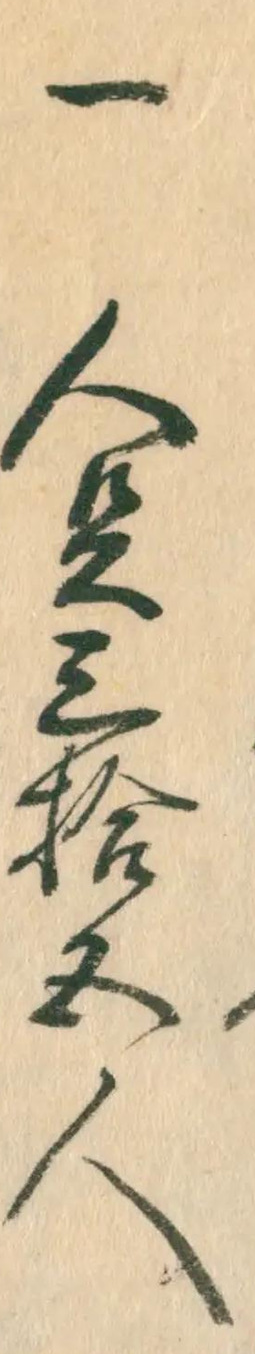一人足三拾五人
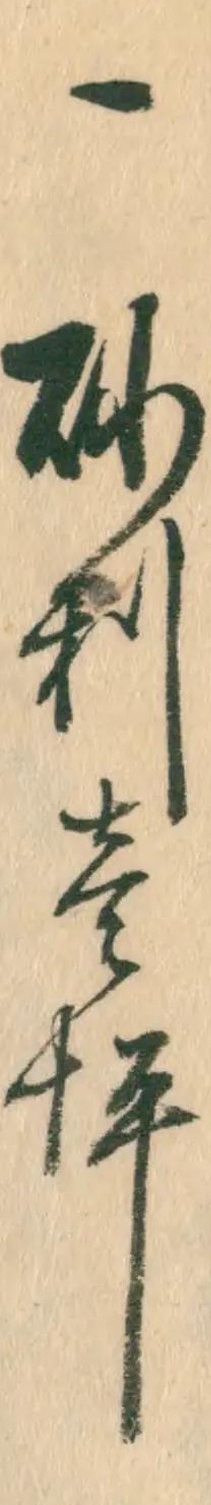一砂利壱坪
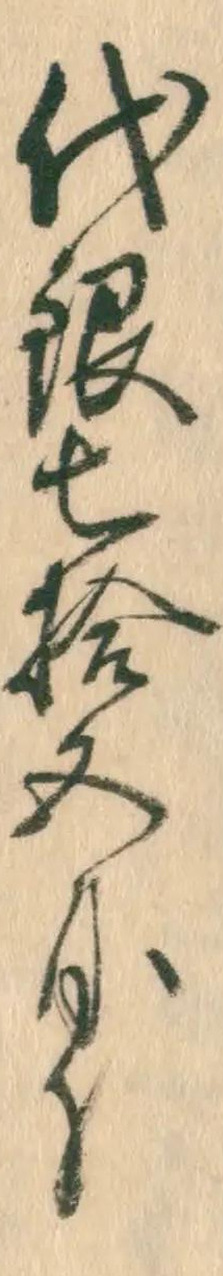代銀七拾五匁
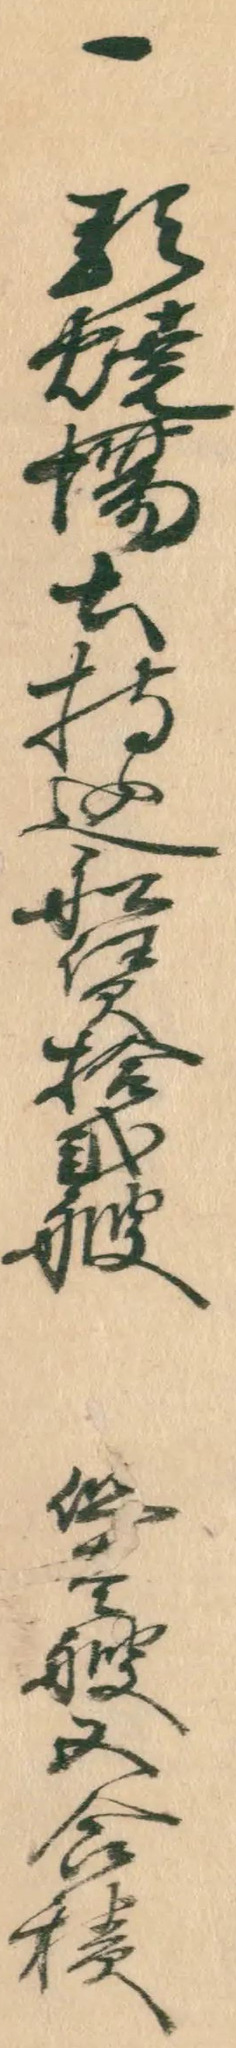一類焼場土持込船賃拾弐艘但壱艘五合積
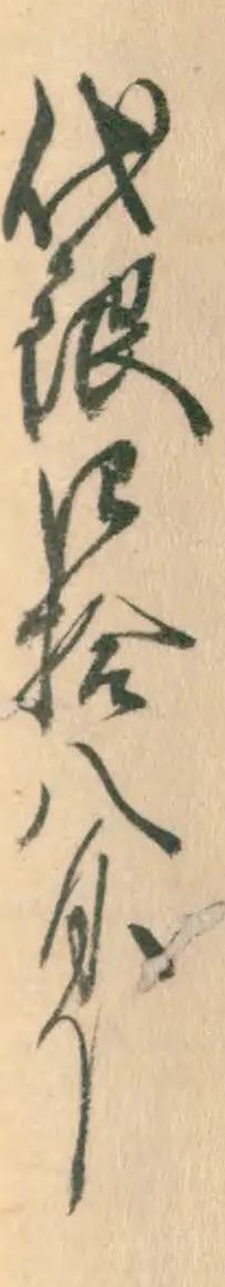代銀七拾五匁
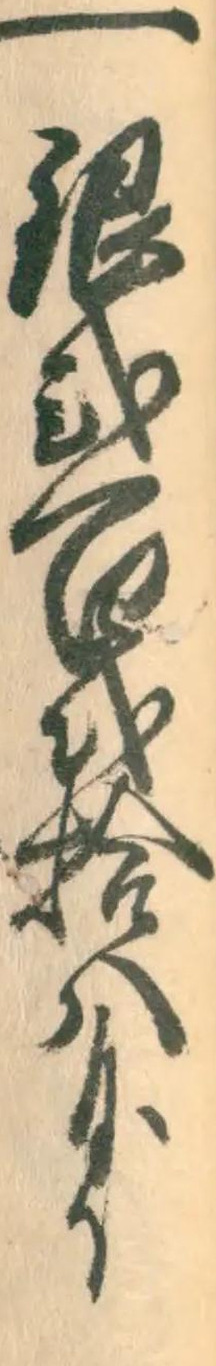〆銀弐百弐拾八匁
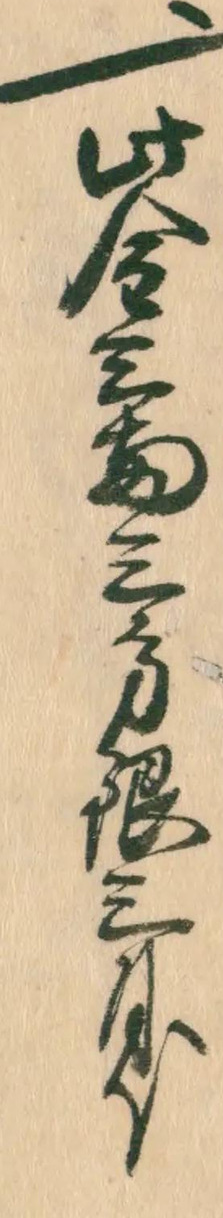此金三両三分銀三匁
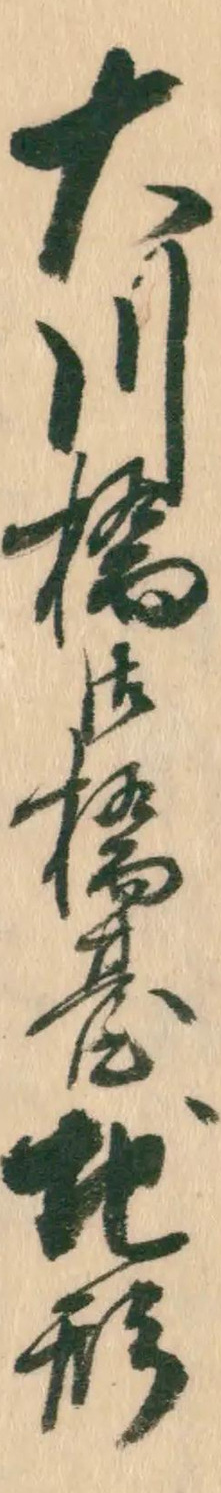大川橋御橋台地形
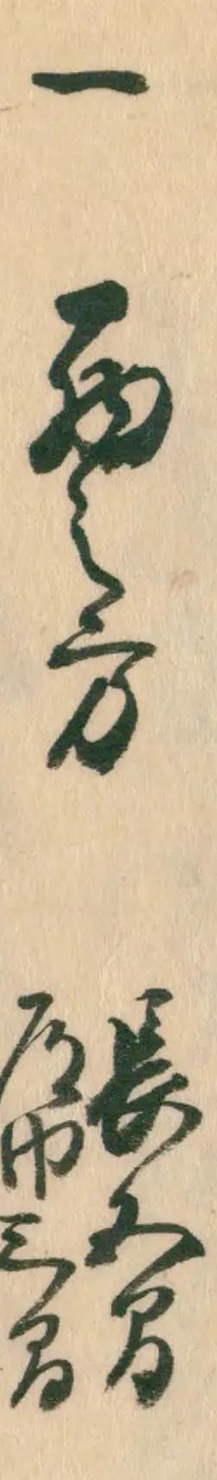一西之方長五間
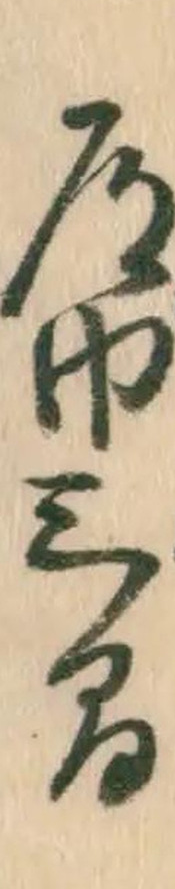道巾三間
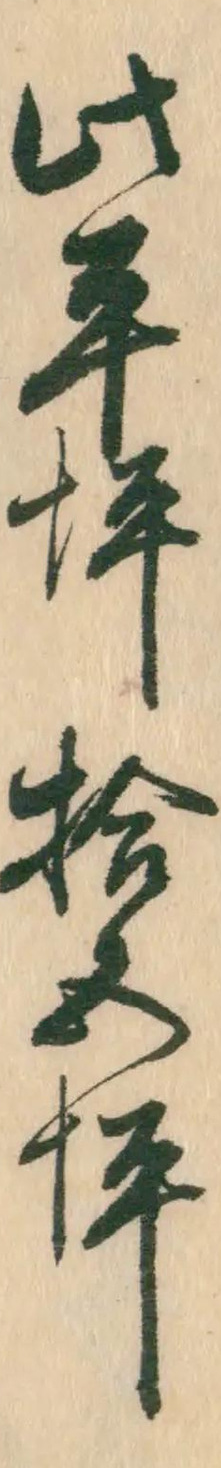此平坪拾五坪
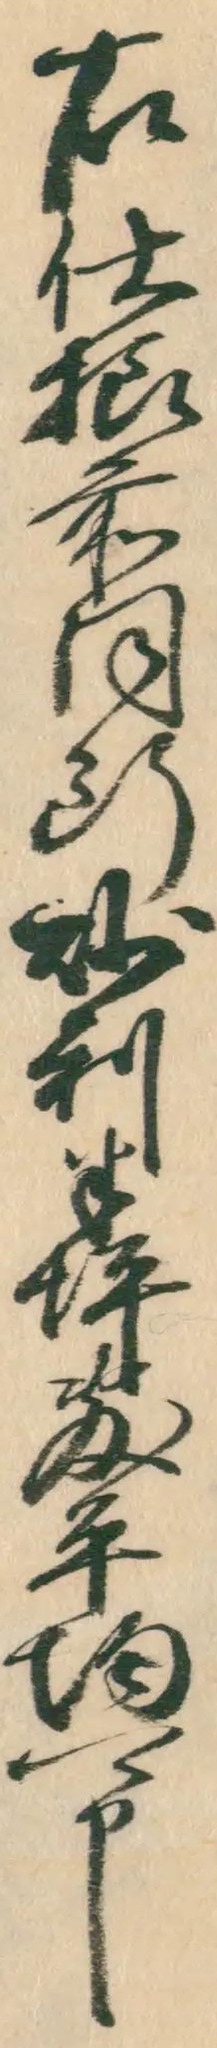右仕様前同断砂利半坪敷平均可申
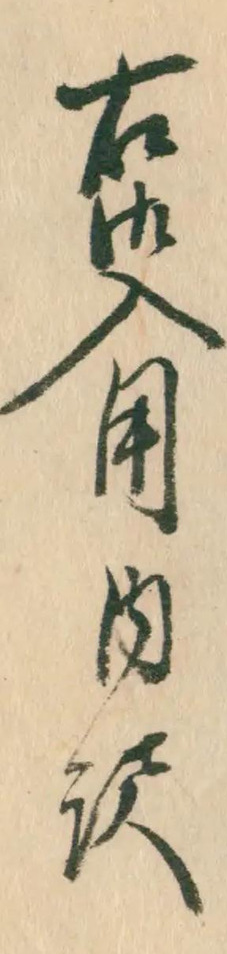右御入用内訳

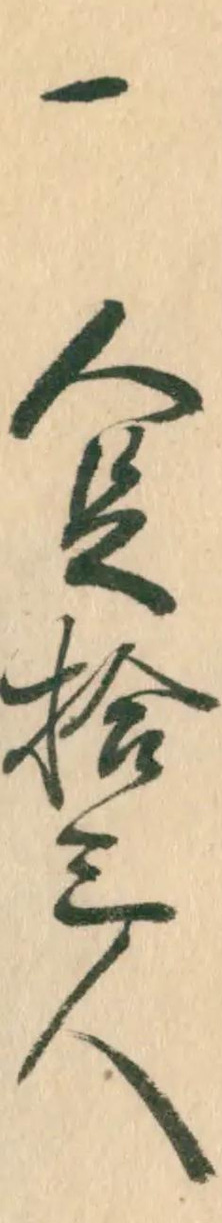一人足拾三人
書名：三橋 17巻. [8] 三橋小破御修復書留　但御奉行御掛リ替地震潰橋番屋　嘉永四亥年より安政二卯年迄　下
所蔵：国立国会図書館 National Diet Library, JAPAN
